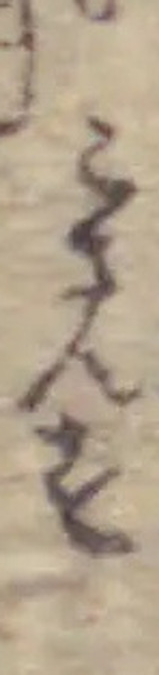こさんす

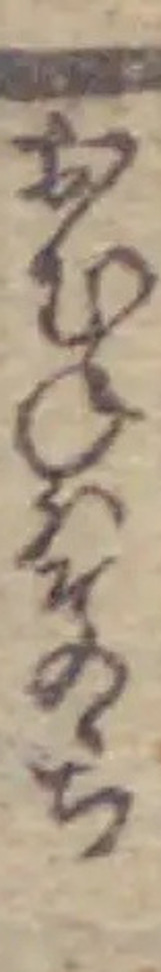おむねはそのゝち
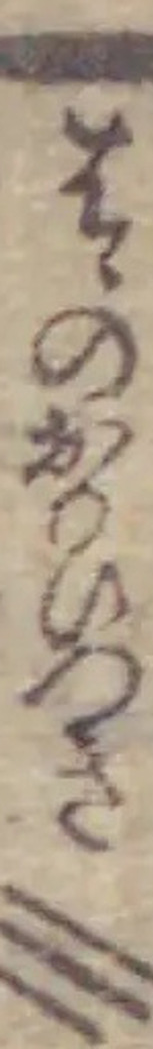はゝのおもひつき
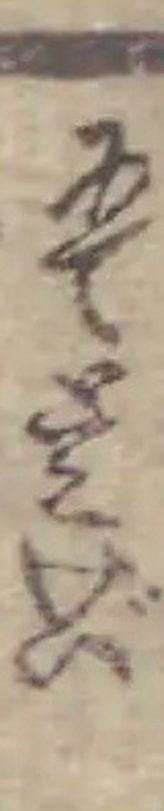にてとこげい
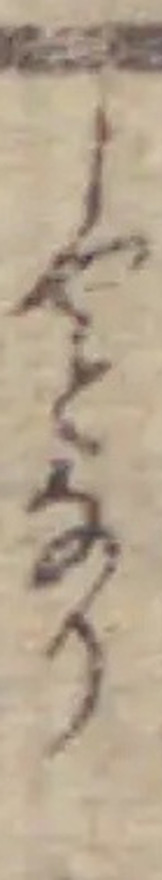しやとなり
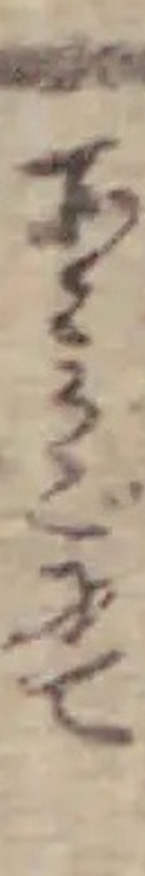所々かごにて
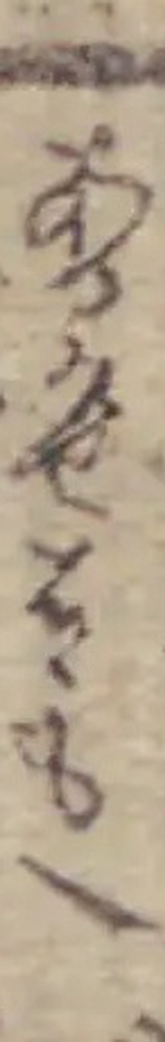あるかせはゝも
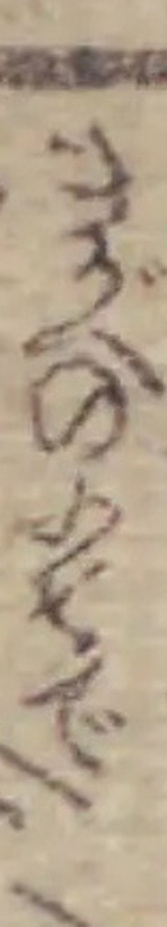きがへの小そで
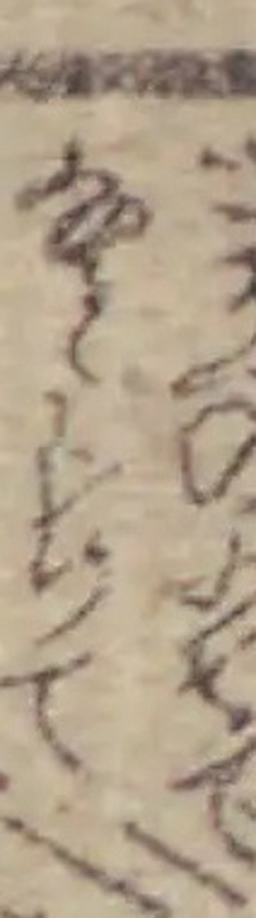なともちて
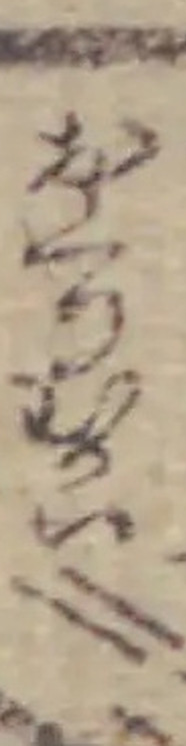おくりむかい
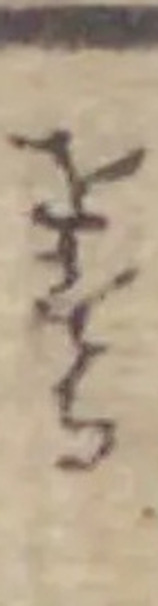をする
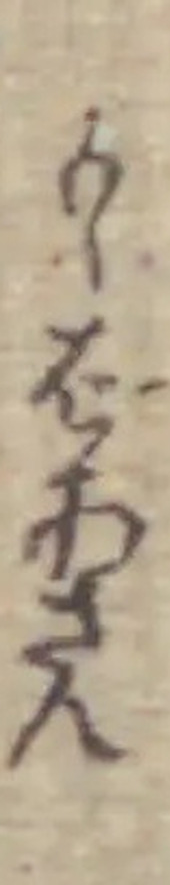もしばあさん
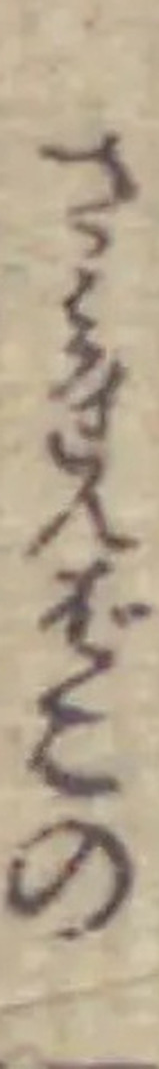さみせんばこの
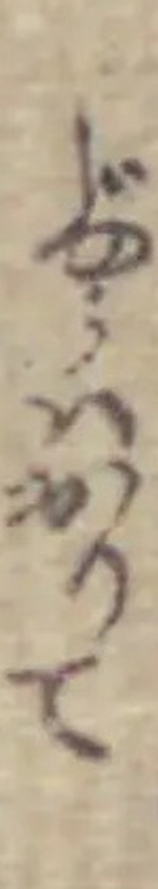じやうはおりて
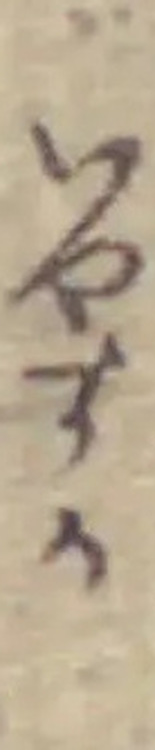いやすか
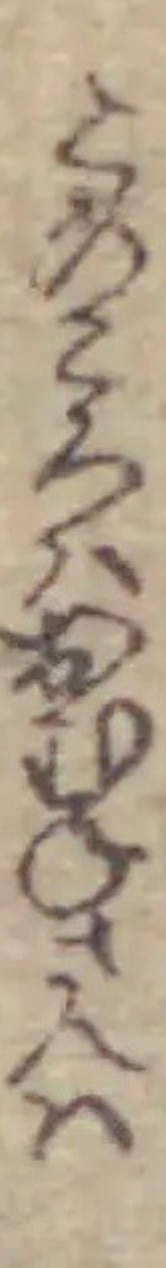このころはおむねさんは
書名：奥州咄 3巻
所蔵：国立国会図書館 National Diet Library, JAPAN
